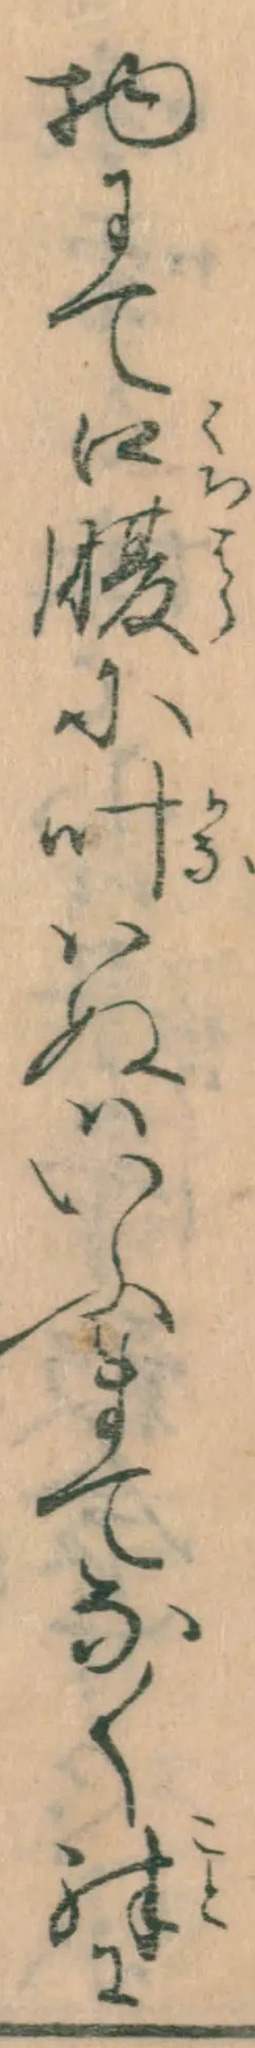物にて口腹に叶はぬはいふまてなく殊に
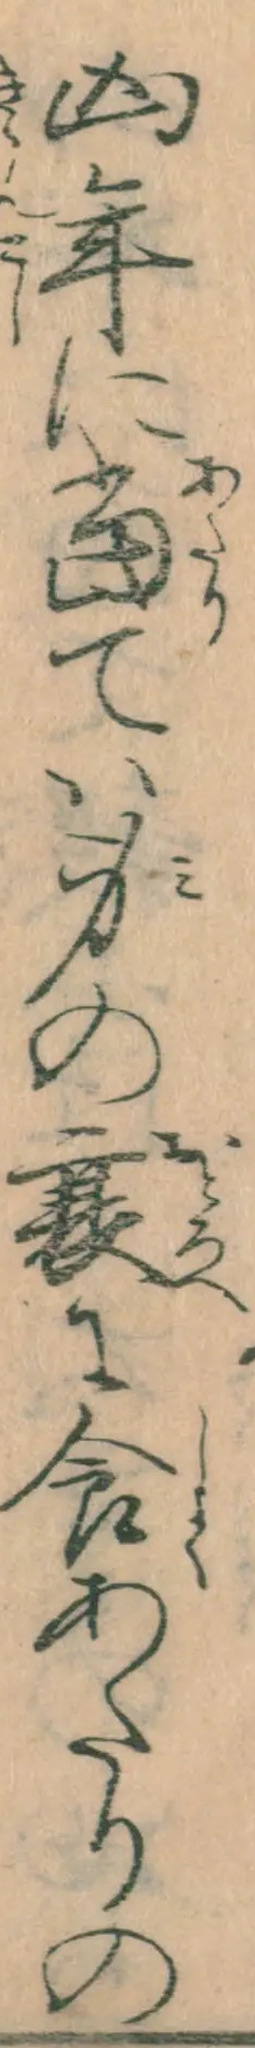凶年に当ては身の衰に食あたりの
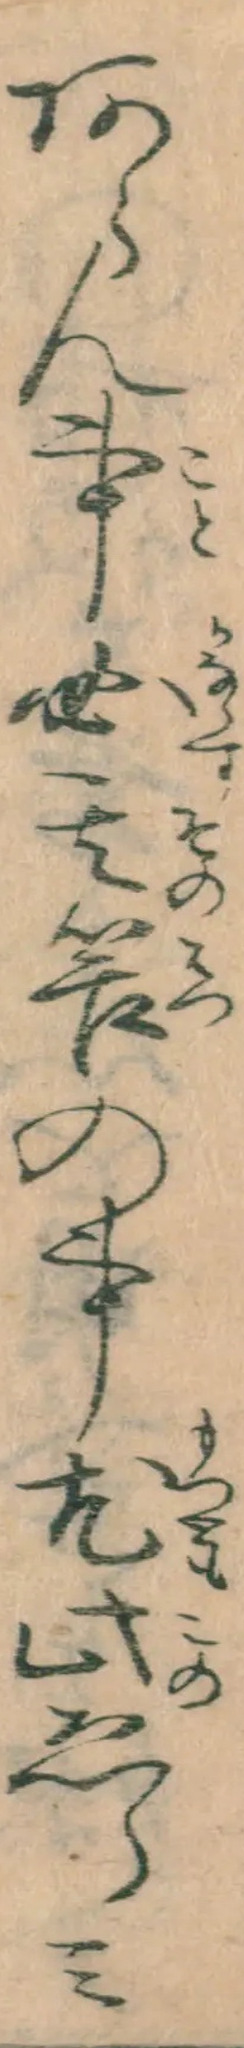あらん事必其筈の事尤此ゑらみ
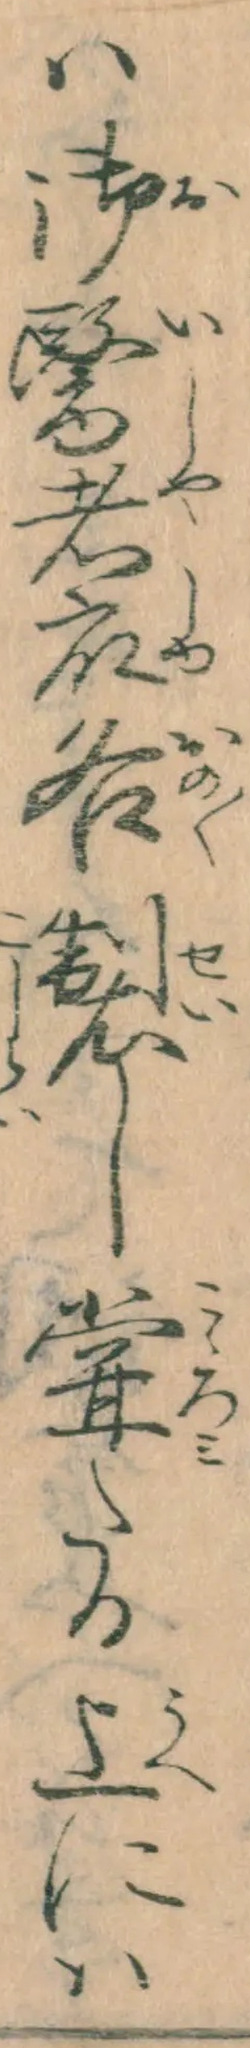は御医者衆各製し嘗たる上には
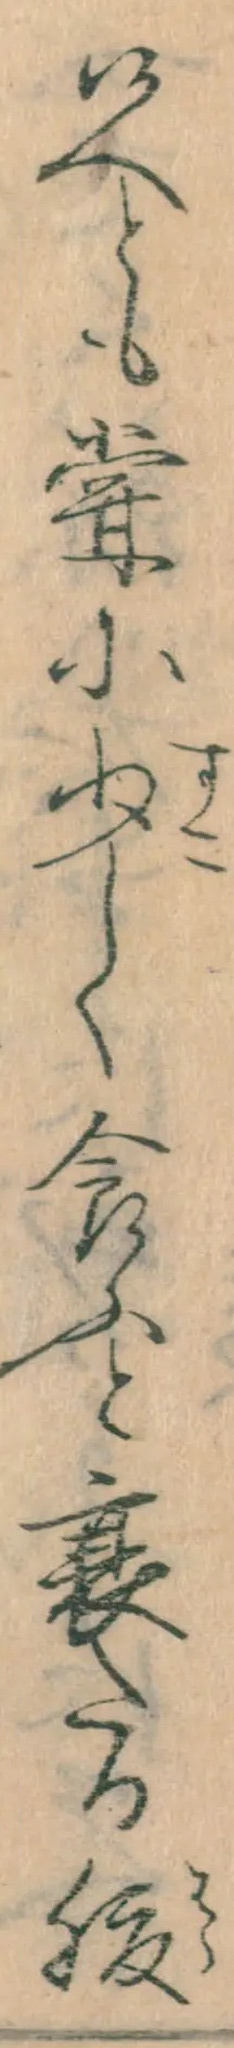候へとも嘗に少しく食ふと衰たる腹
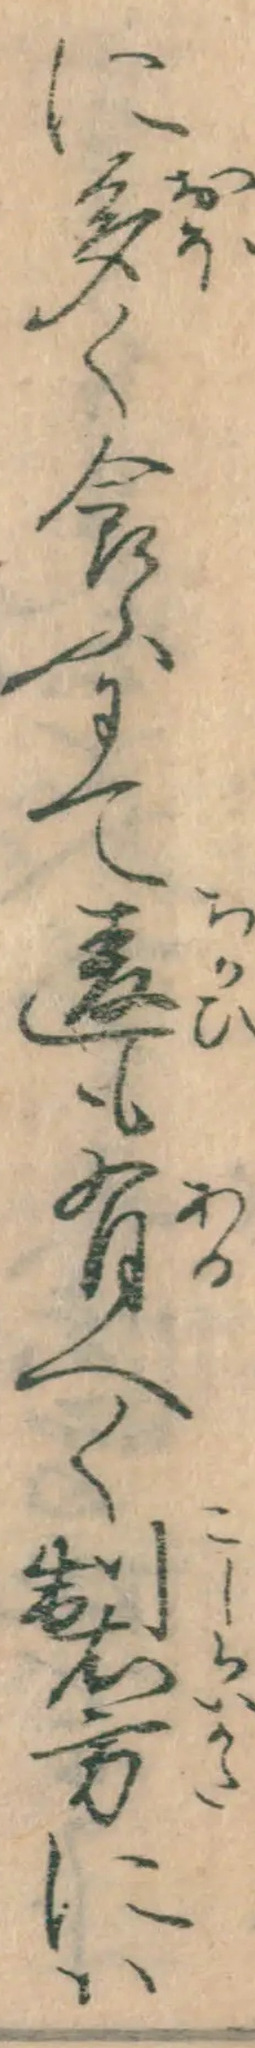に多く食ふにて違も有へく製方には

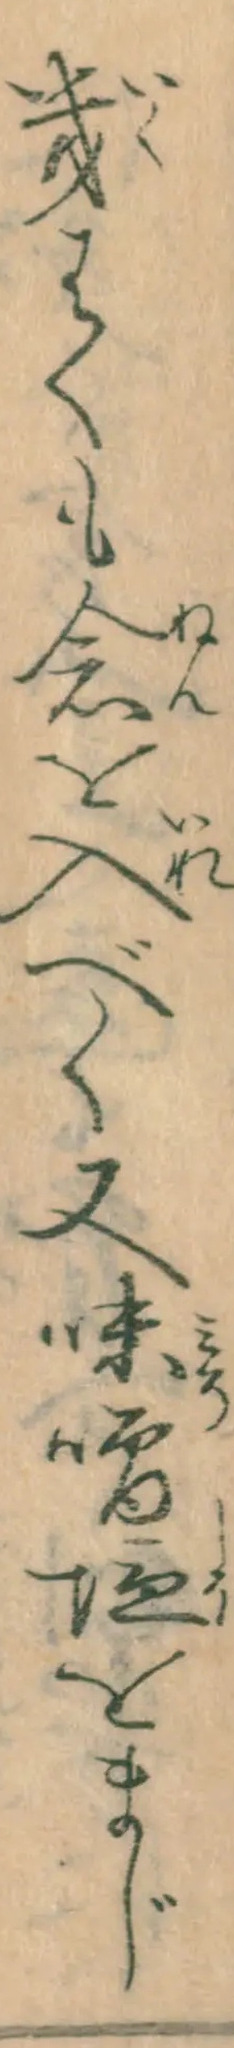幾はくも念を入べく又味噌塩をまじ
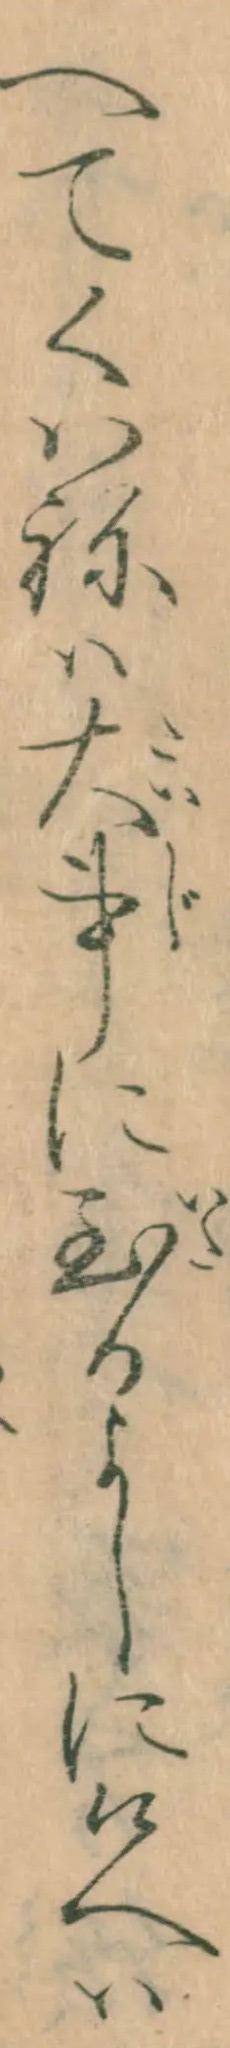へてくはねは大事に至るよしに候へは
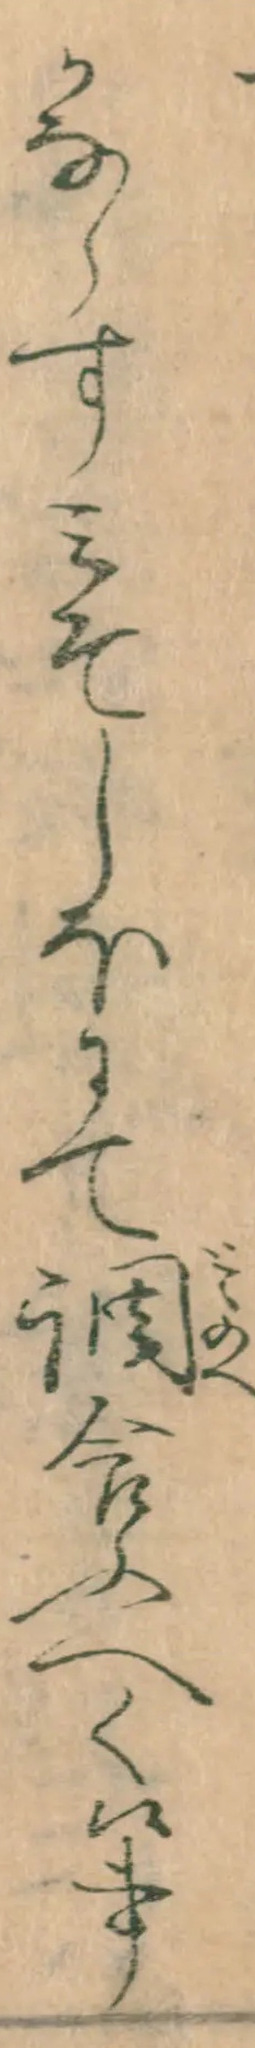かならすみそしほにて調食ふへく候事
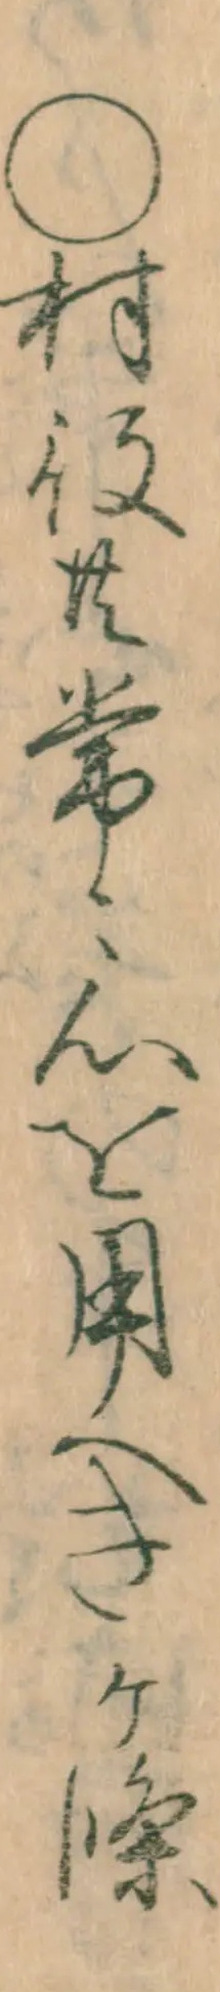○村役共常々心を用へきケ条
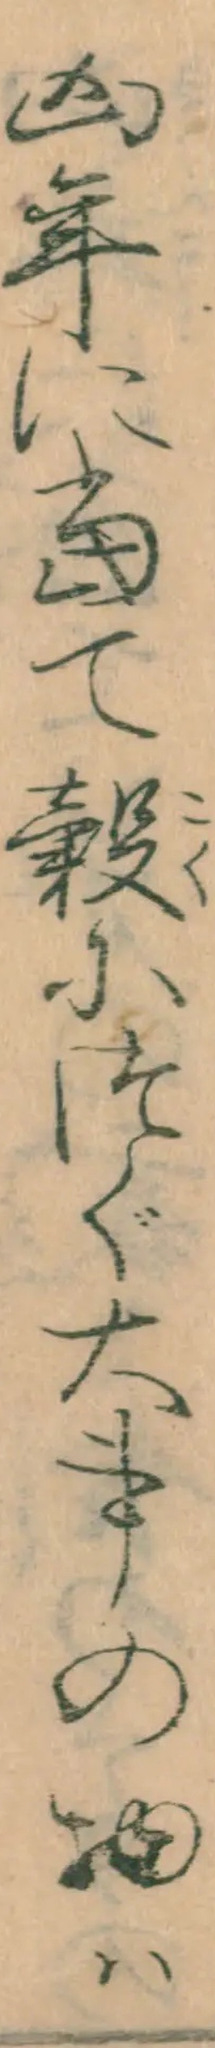凶年に当て穀につぐ大事の物は
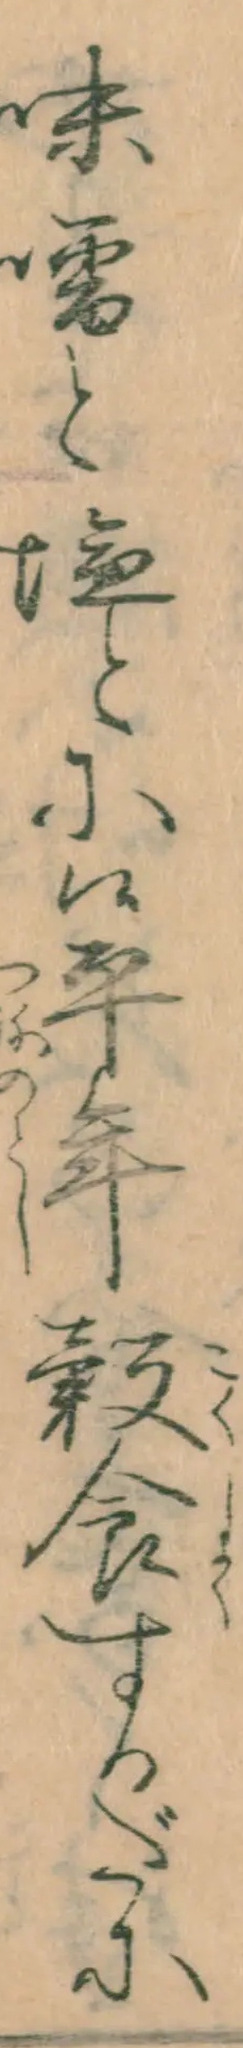味噌と塩とに候平年穀食するだに
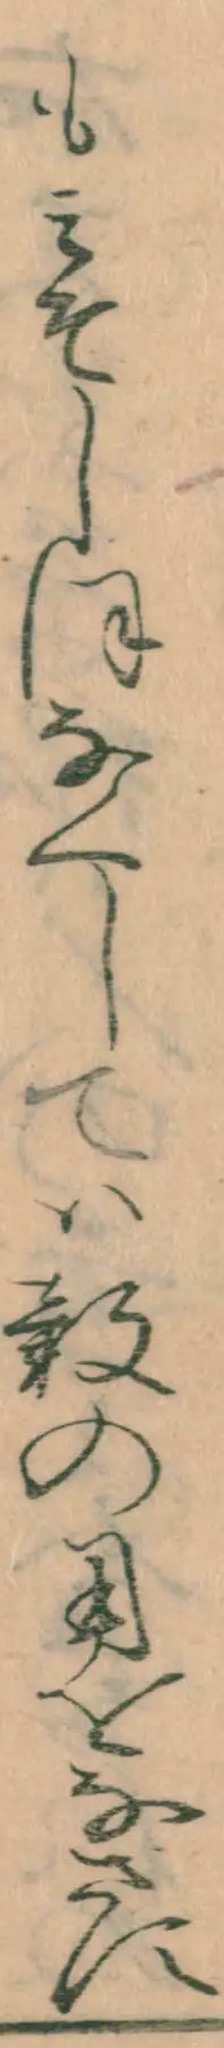もみそしほなくしては穀の用をなさず
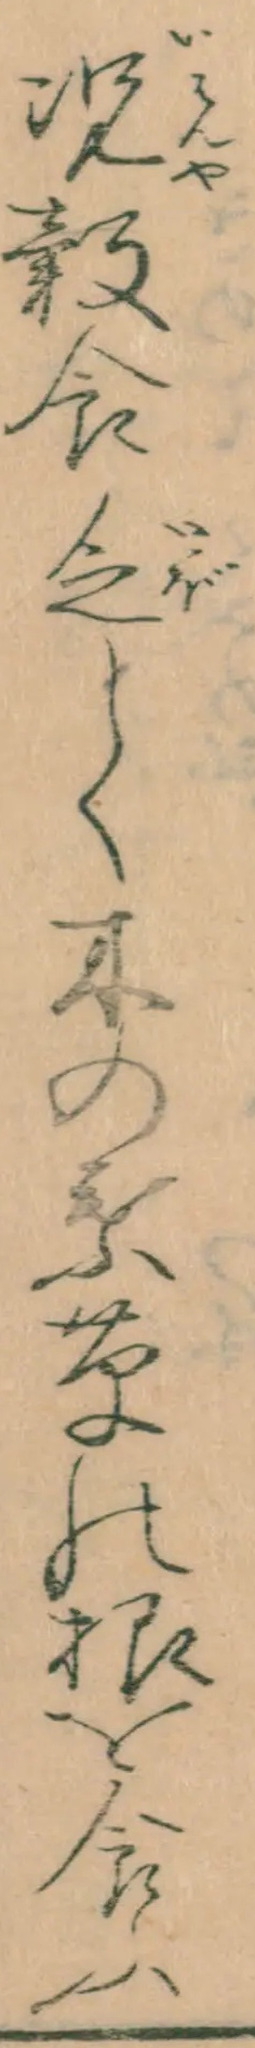况穀食乏しく木の葉草の根を食ふ
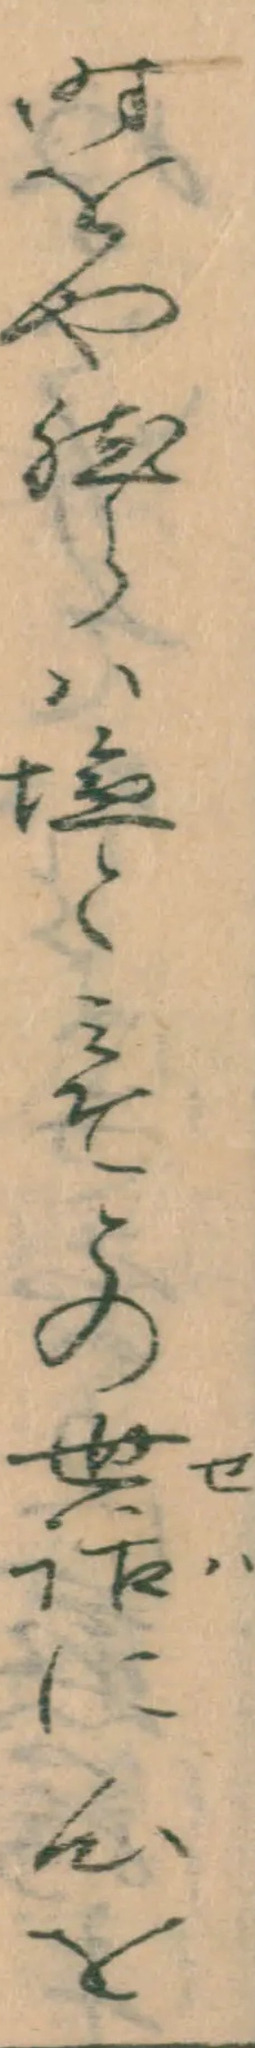時をや然らは塩とみそとの世話に心を
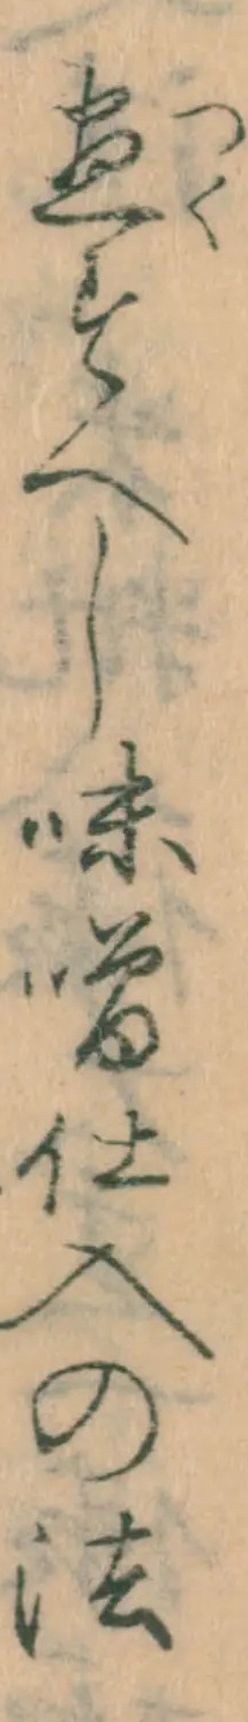尽すへし味噌仕入の法
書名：かてもの
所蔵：国立国会図書館 National Diet Library, JAPAN
